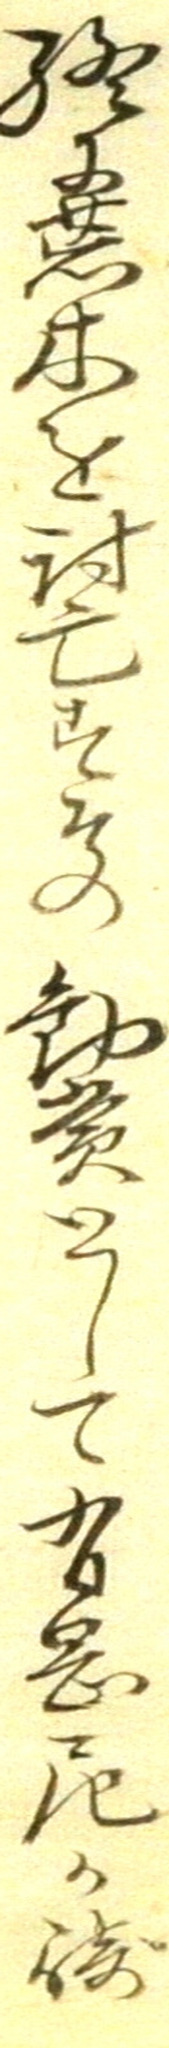終に荒木を討亡すその勘賞として有岡尼か崎
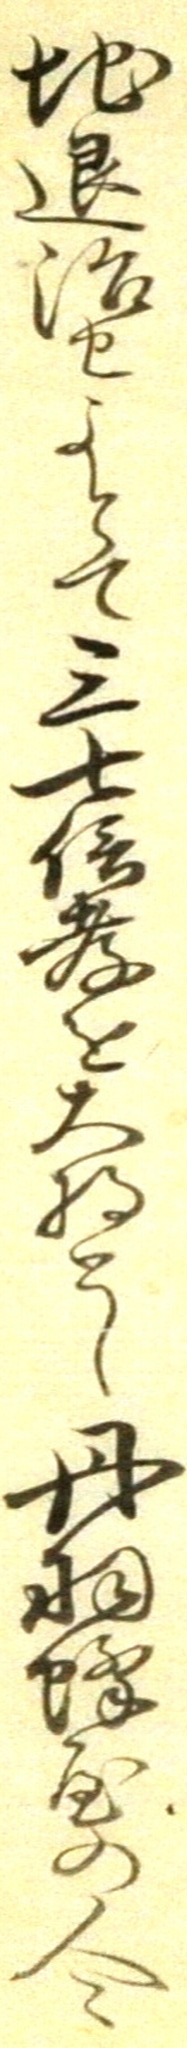地退治せよとて三七信孝を大将とし丹羽蜂屋人々
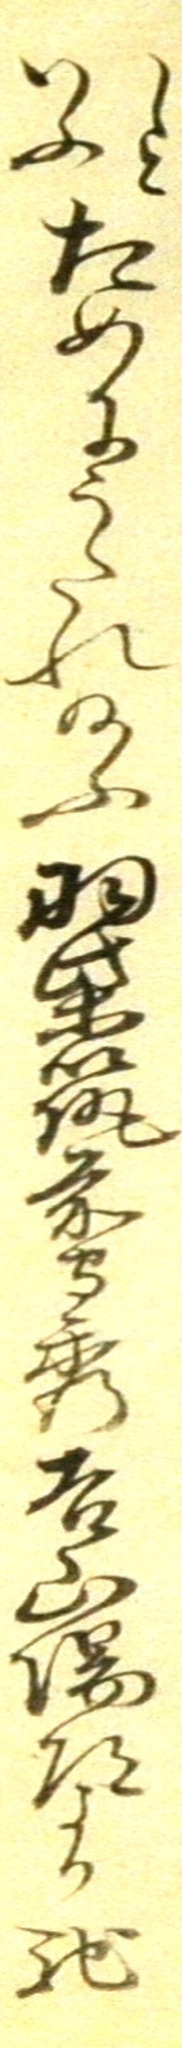しといふためにうたれ給ふ羽柴筑前守秀吉山陽道より馳
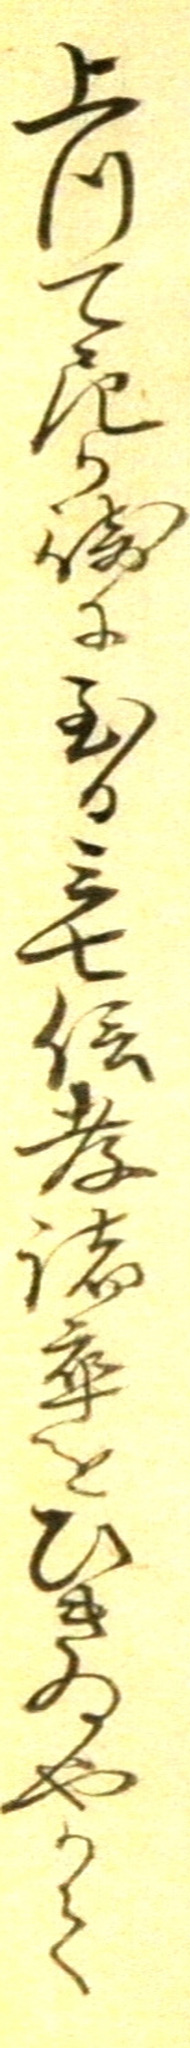上つて尼か崎に至る三七信孝諸卒をひきゐやかて

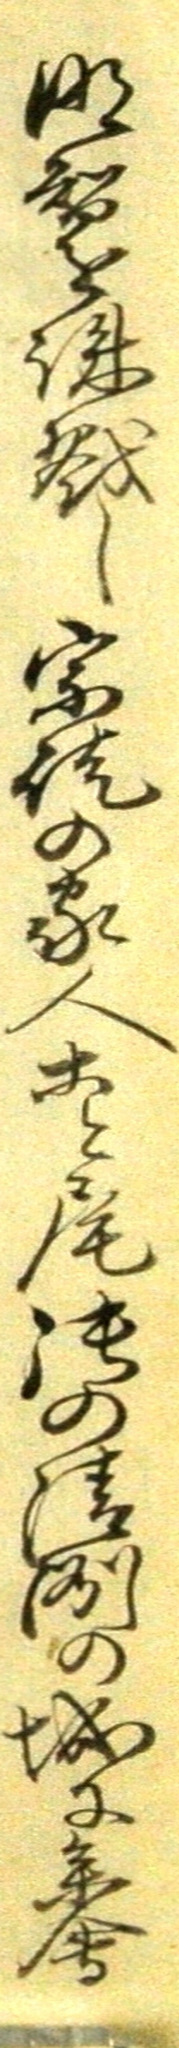明智を誅戮し宗徒の家人等と尾張の清洲の城に参会
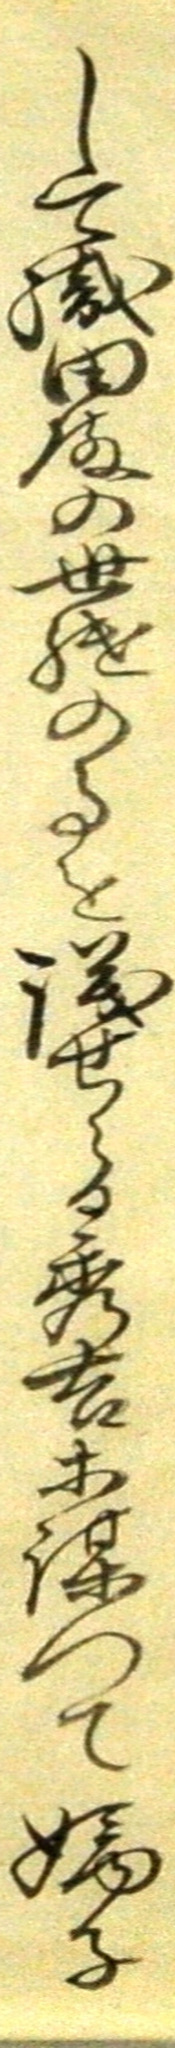して織田殿の世継の事を議せらる秀吉等謀つて嫡子
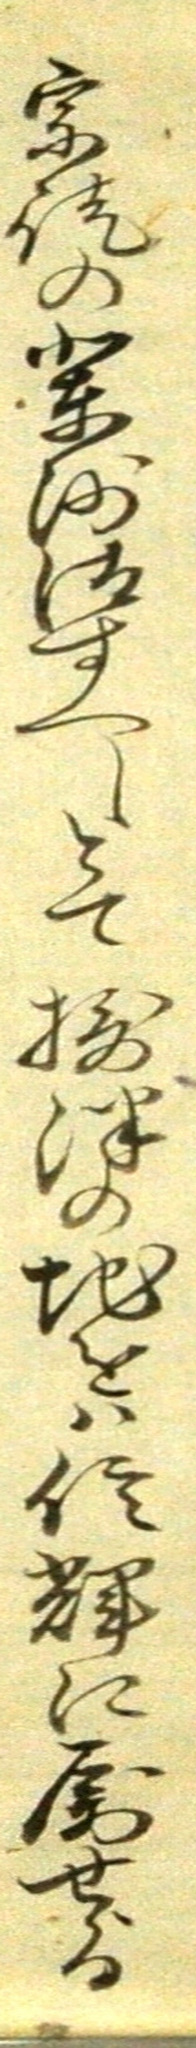宗徒の輩沙汰すへしとて摂津の地をは信輝に属せらる
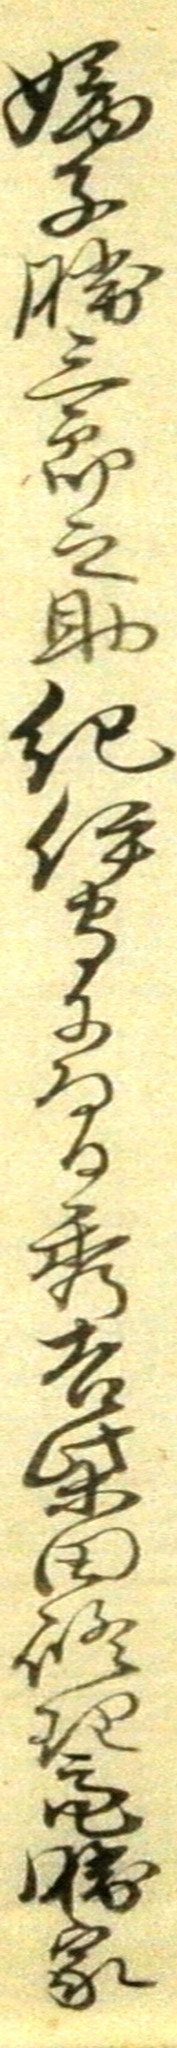嫡子勝三郎之助紀伊守になる秀吉柴田修理亮勝家
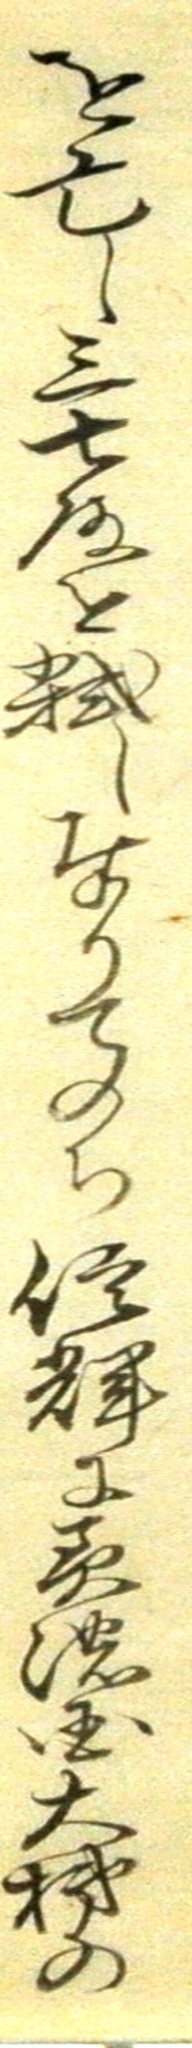を亡し三七殿を弑し奉りてのち信輝に美濃国大柿の
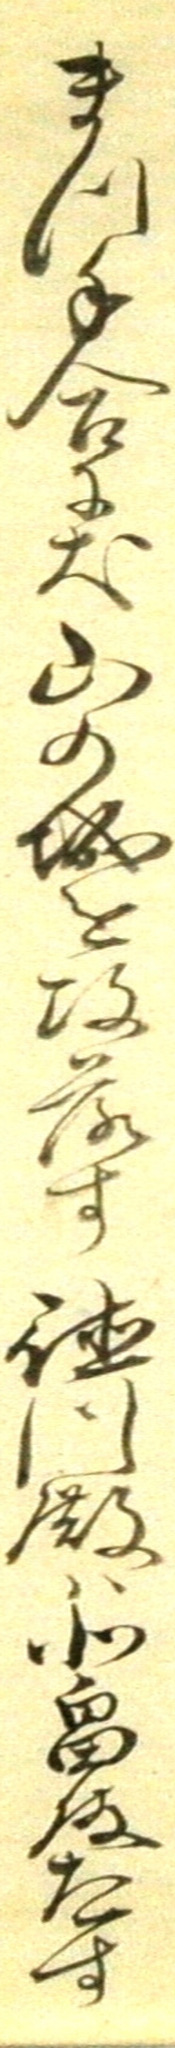まつ手合に犬山の城を攻落す徳川殿は北畠殿たす
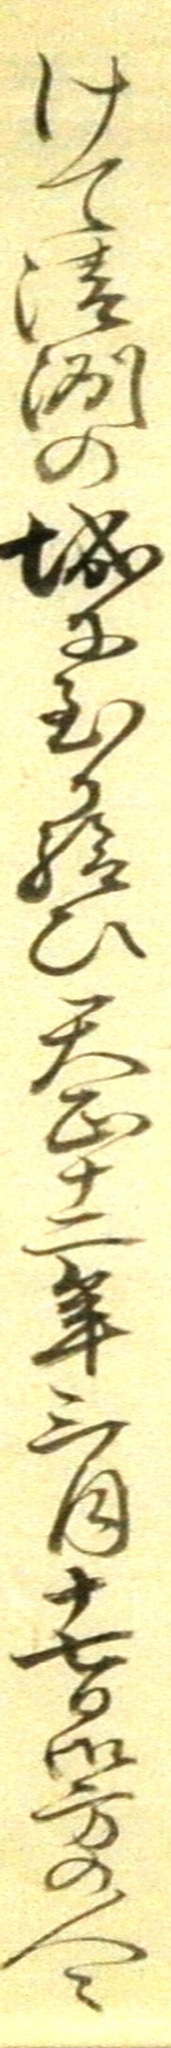けて清洲の城に至り給ひ天正十二年三月十七日御方の人々
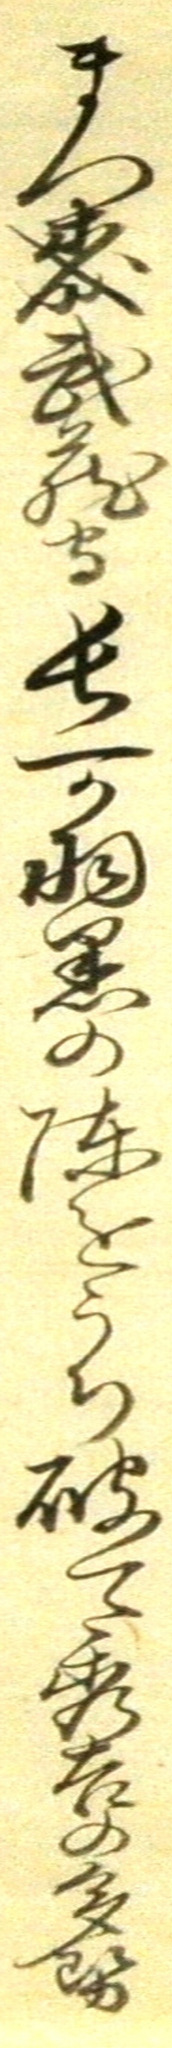まつ森武蔵守長一か羽黒の陣をうち破て秀吉の多勢
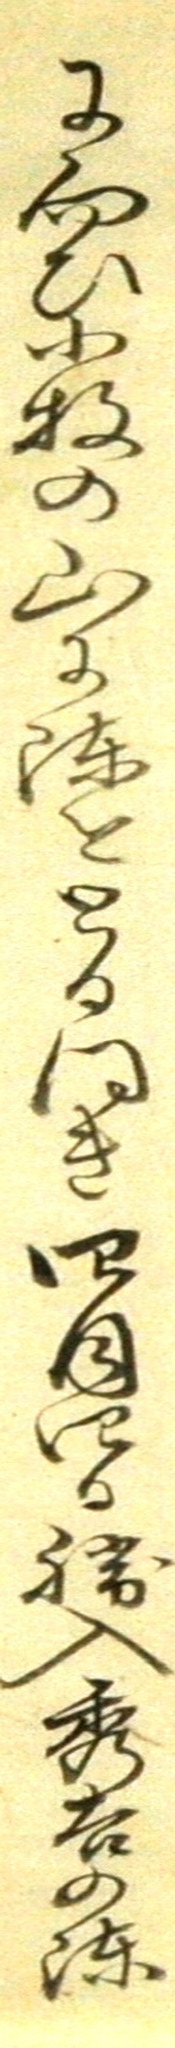に向ひ小牧の山に陣をとる同き四月四日勝入秀吉の陣
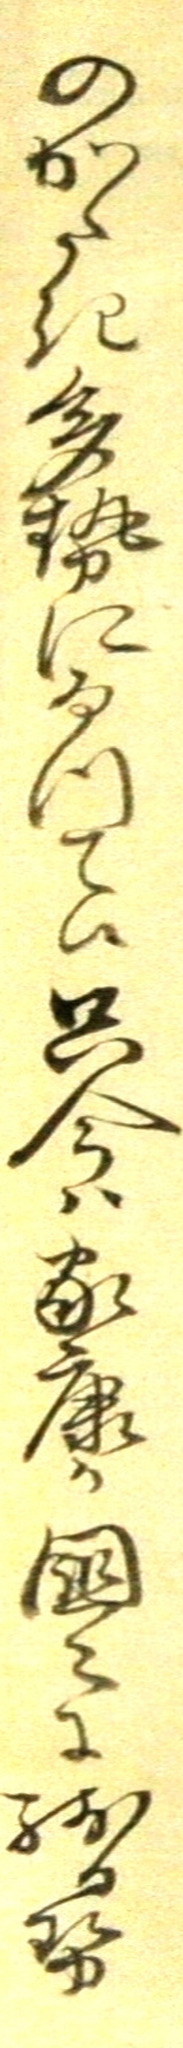のかたき多勢になつて候只今は家康か国々に残る勢

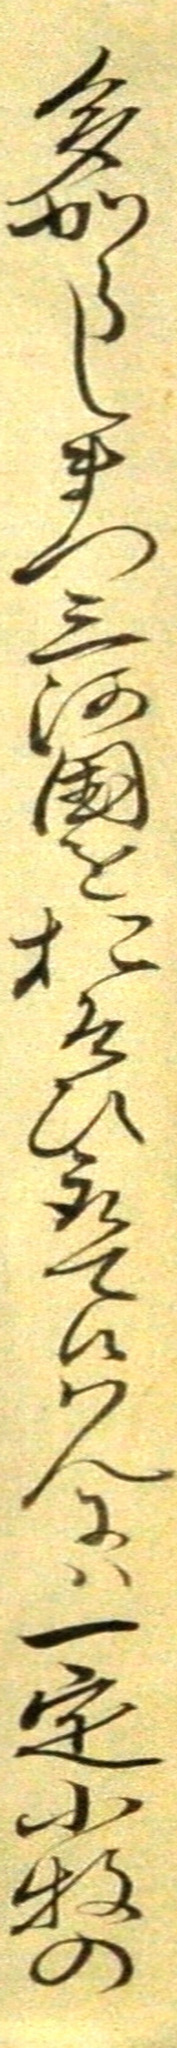多からしまつ三河国をおそひ取て候わんには一定小牧の
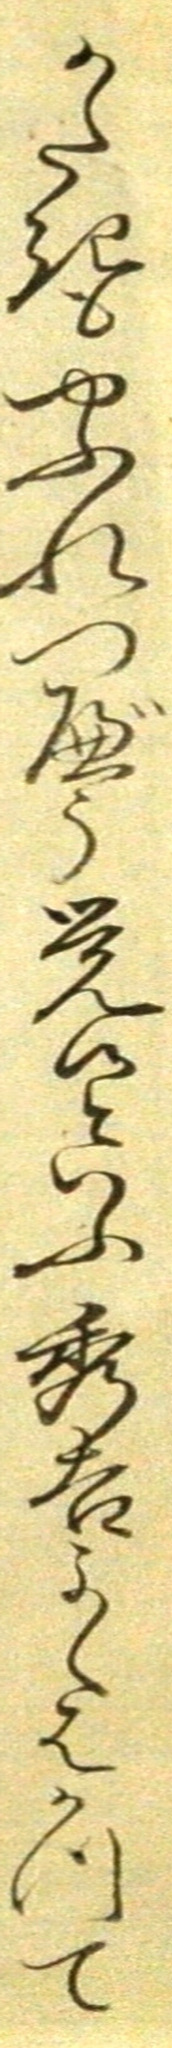かたきもやふれつべう覚候といふ秀吉よくはかつて
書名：藩翰譜（七・上）
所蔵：伊那市立高遠町図書館・合同会社AMANE
